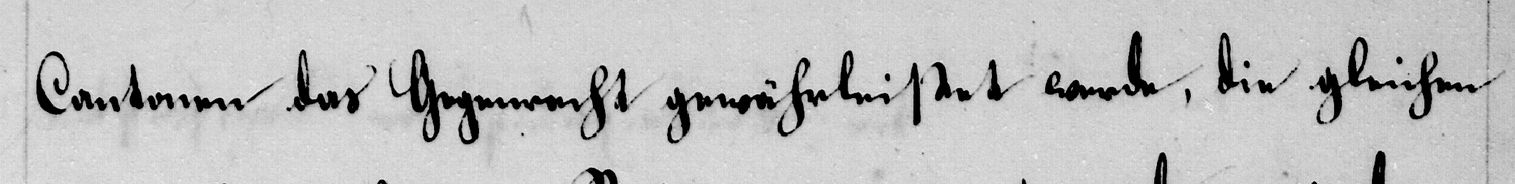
Cantonen das Gegenrecht gewährleistet werde, die gleichen
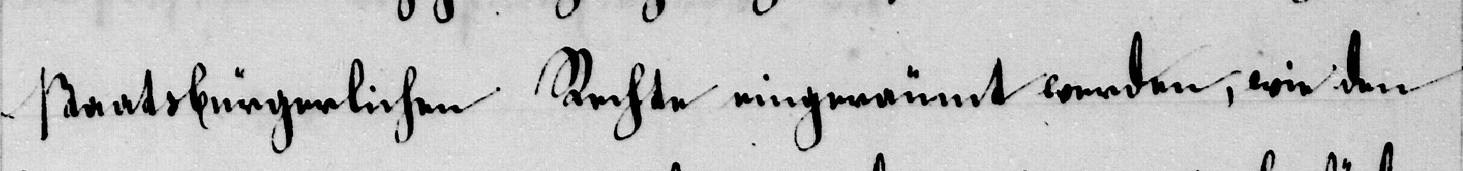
Staatsbürgerlichen Rechte eingeräumt werden, wie den
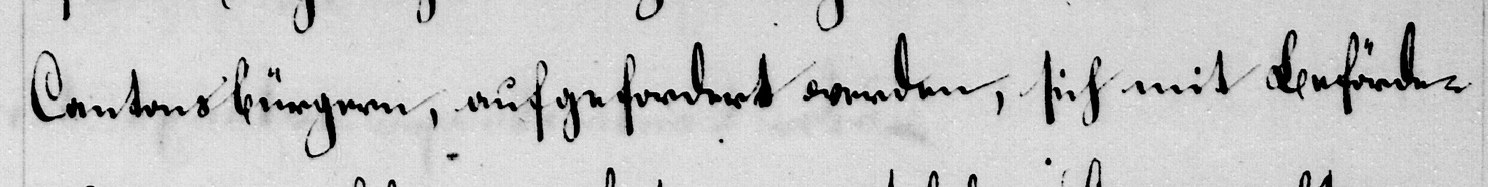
Cantonsbürgern, aufgefordert werden, sich mit Beförde¬
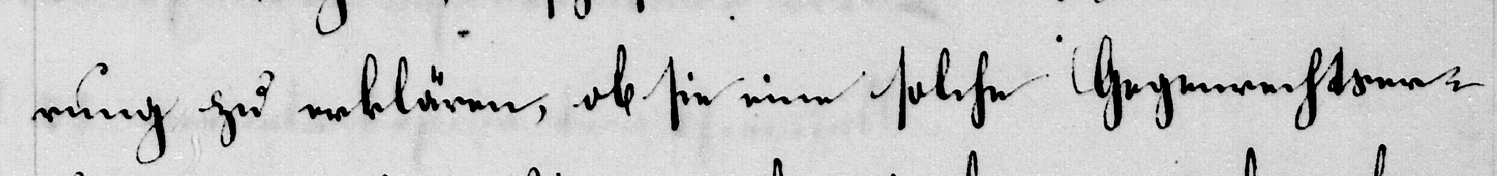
rung zu erklären, ob sie eine solche Gegenrechtser¬
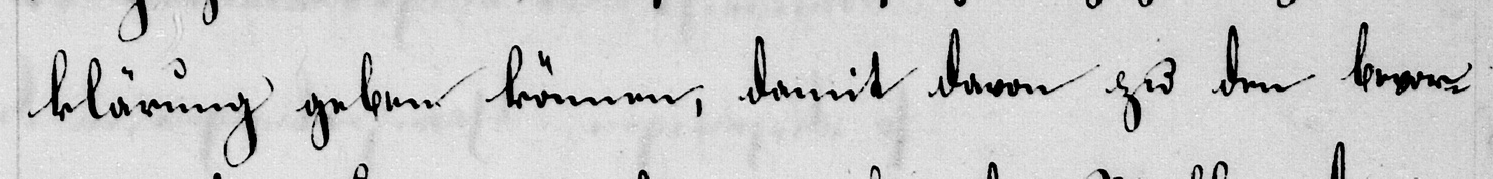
klärung geben können, damit davon zu den bevor¬
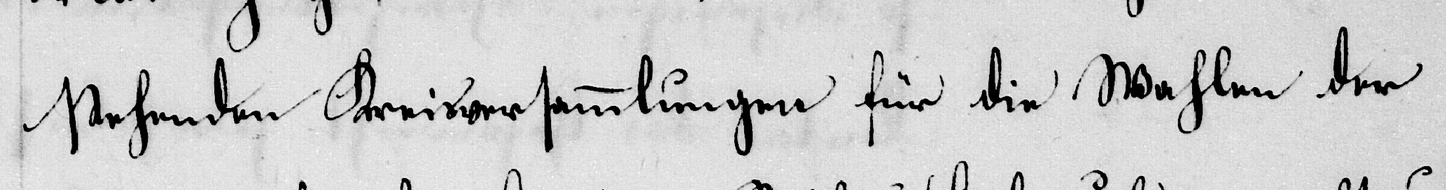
stehenden Kreisversammlungen für die Wahlen der
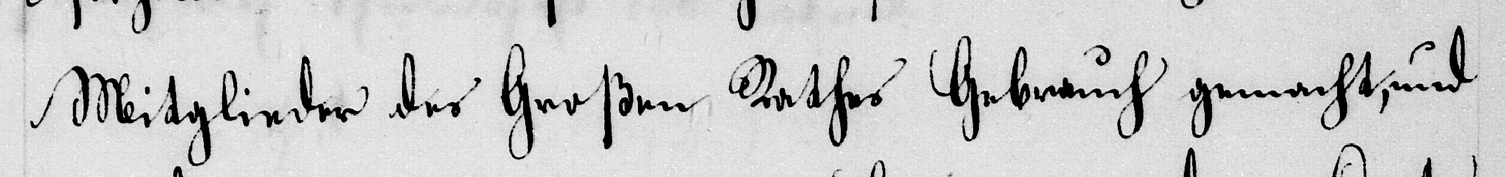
Mitglieder des Großen Rathes Gebrauch gemacht, und
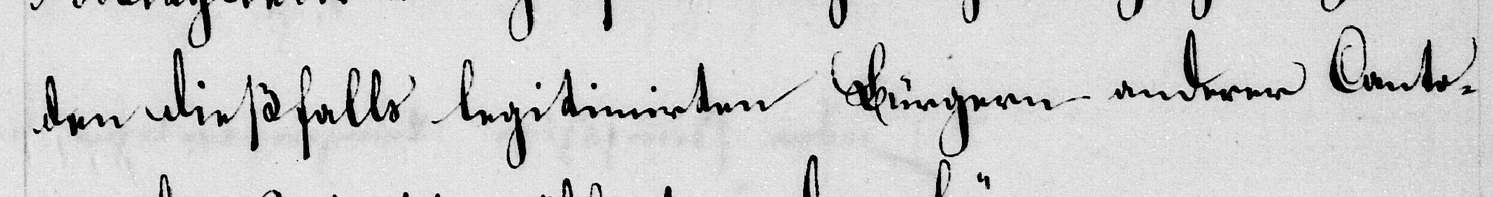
den dießfalls legitimirten Bürgern anderer Canto¬
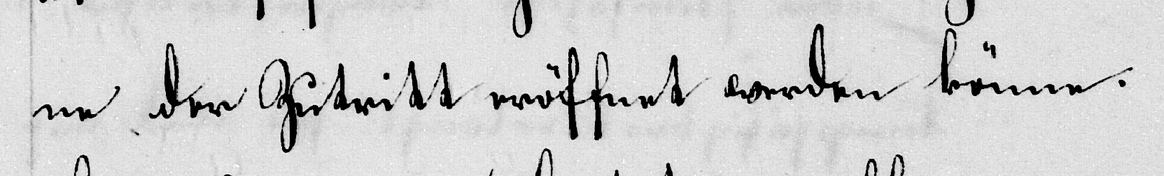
ne der Zutritt eröffnet werden könne.
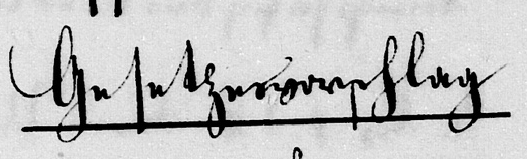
Gesetzesvorschlag
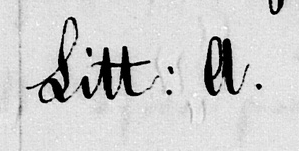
Litt: A.
